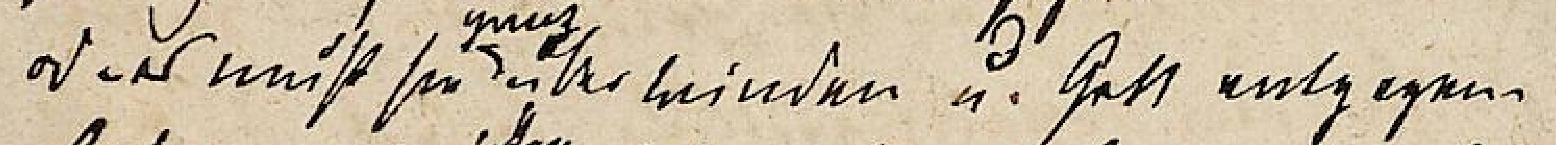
od. es muß sie überwinden u. Gott entgegen¬
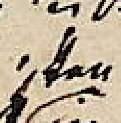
ten
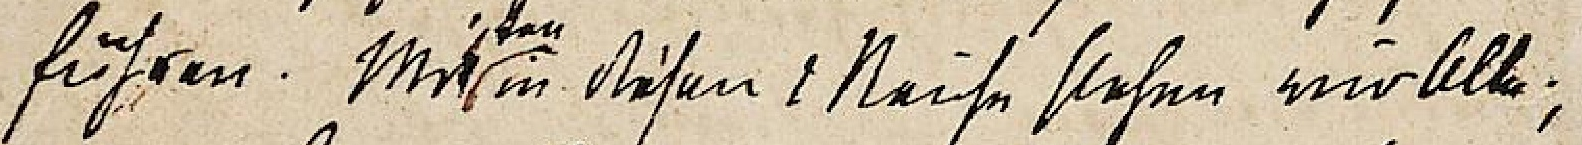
führen. Mit in diesem 1 Reiche stehen wir Alle;
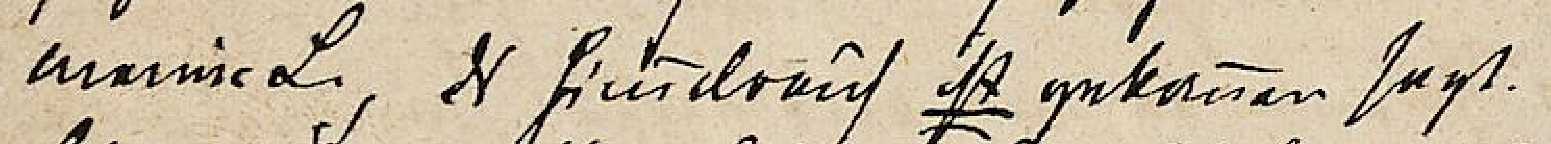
meine L., ds Himelreich ist gekomen sagt
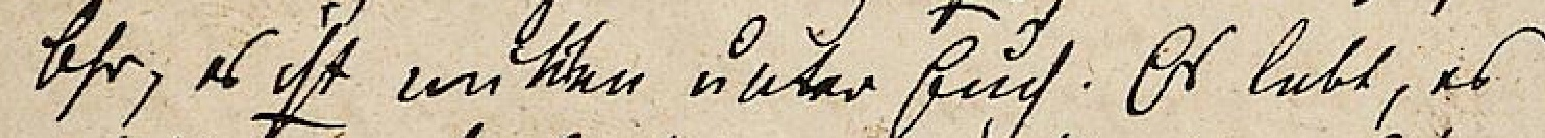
Chr, es ist mitten unter Euch. Es lebt, es
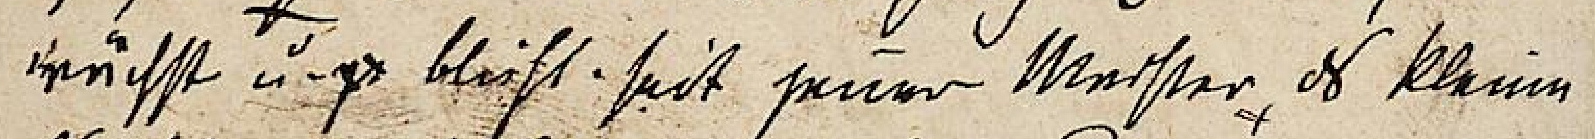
wächst u. blüht seit jener Meister ds kleine
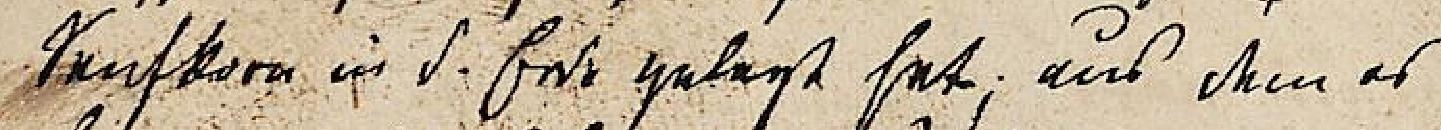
Senfkorn in d. Erde gelegt hat, aus dem es
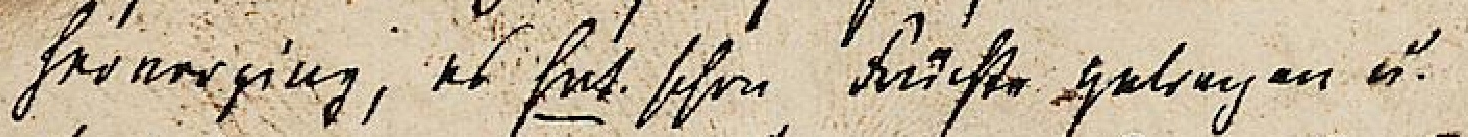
hervorging, es hat schon Früchte getragen u.
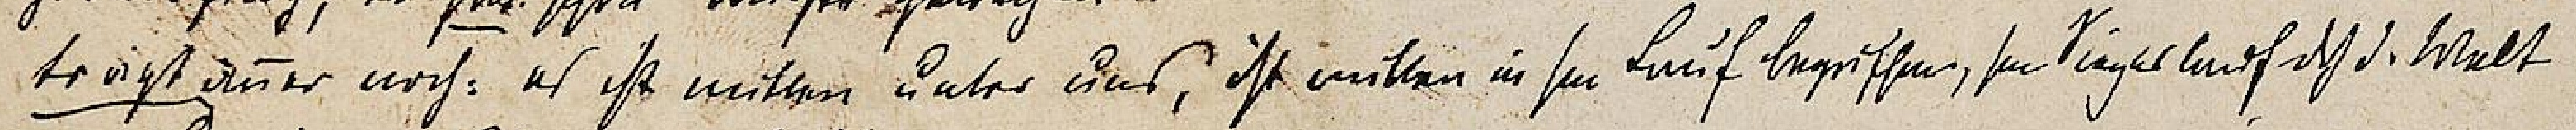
trägt imer noch: es ist mitten unter uns, ist mitten in sm Lauf begriffen, sm Siegerlauf dch d. Welt
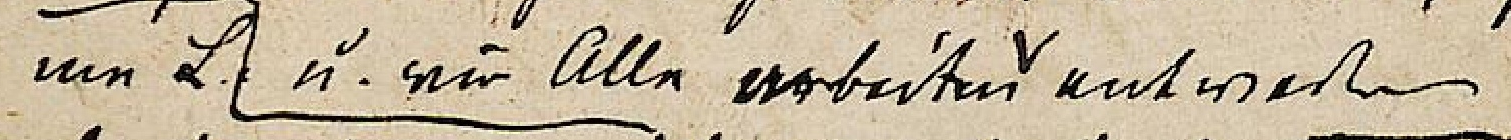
mn L. u. wir Alle arbeitn entweder
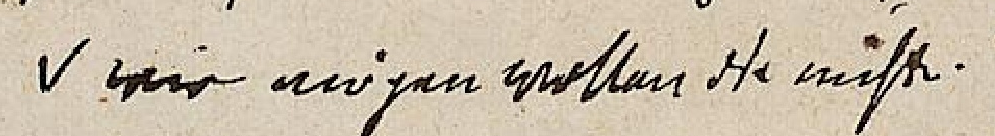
V wir mögen wollen od. nicht
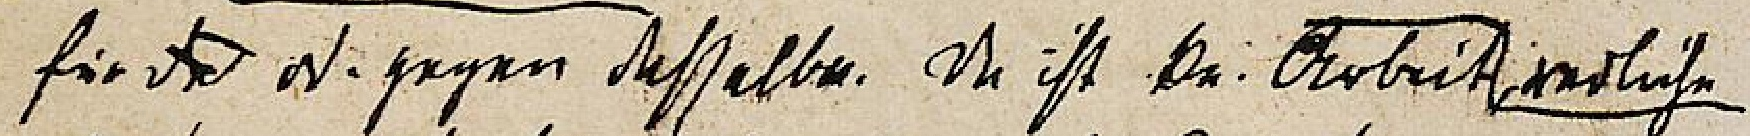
für die od. gegen dasselbe. Da ist kn. Arbeit redliche
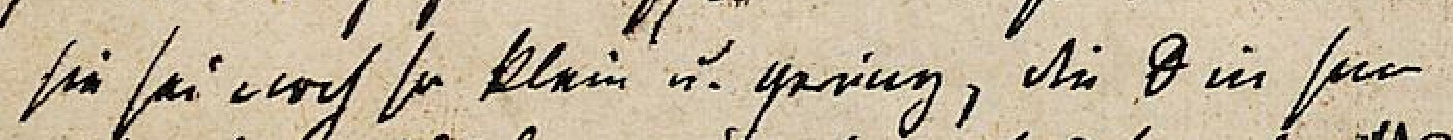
sie sei noch so klein u. gering, die o in snm
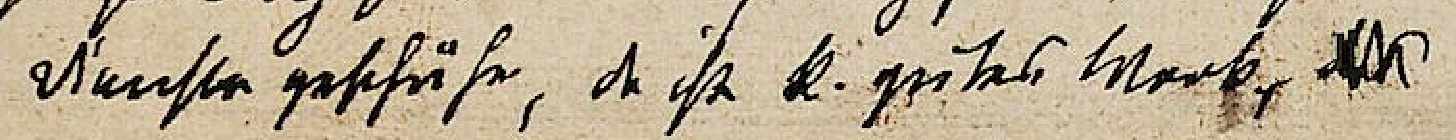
Dienste geschähe, da ist k. gutes Werk, ds
